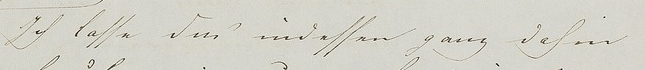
Ich lasse das indessen ganz dahin
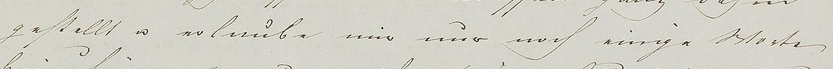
gestellt & erlaube mir nur noch einige Worte
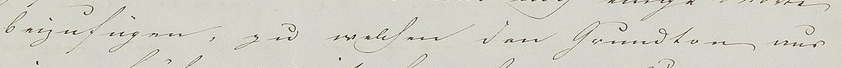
beizufügen, zu welchen der Grundton aus
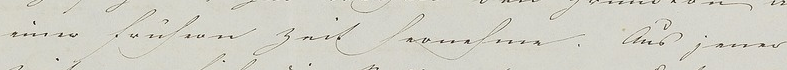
einer frühern Zeit hernehme. Aus jener
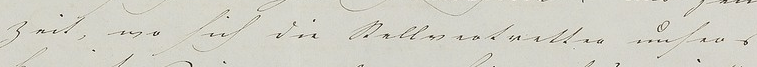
Zeit, wo sich die Stellvertretter unsers
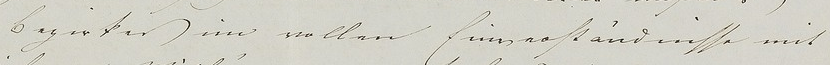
Bezirkes im vollen Einverständnisse mit
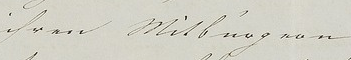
ihren Mitbürgern
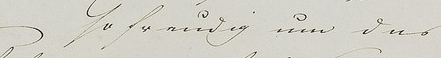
so freudig um das
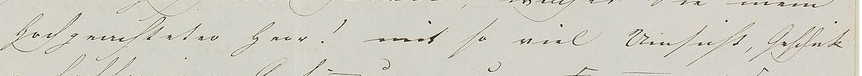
hochgeachteter Herr! mit so viel Umsicht, Geschick
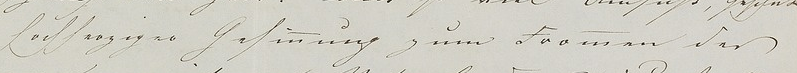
hochherziger Gesinnung zum Formmen des
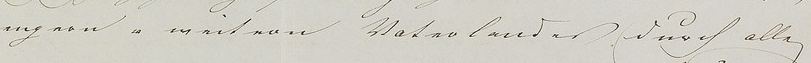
engern & weitern Vaterlandes durch alle
